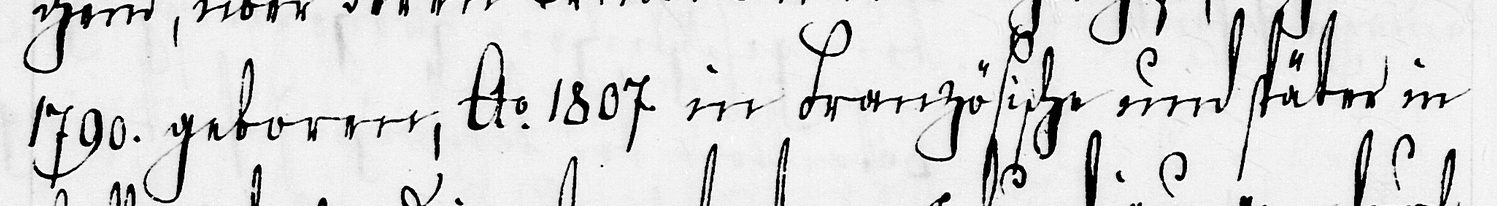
1790. geboren, Ao. 1807. in Französische und später in
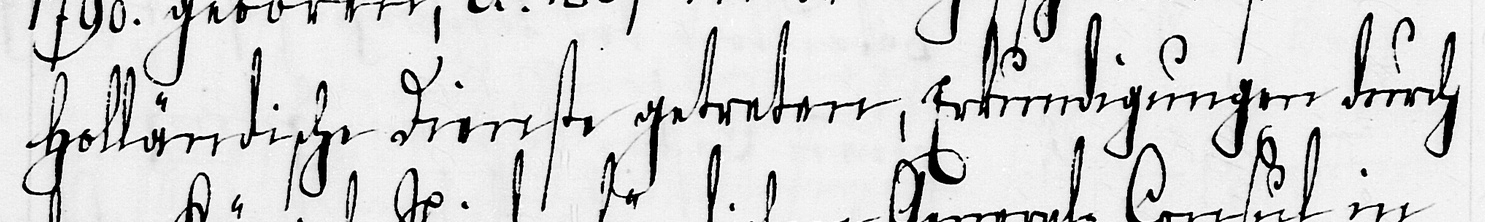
Holländische Dienste getreten, Erkundigungen durch
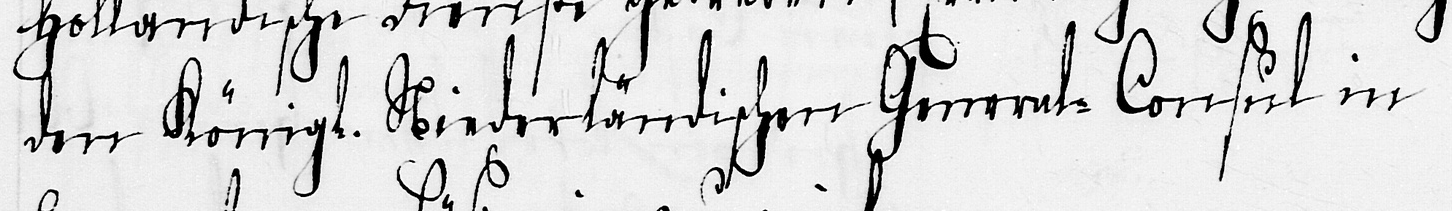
den Königl. Niederländischen General-Consul in
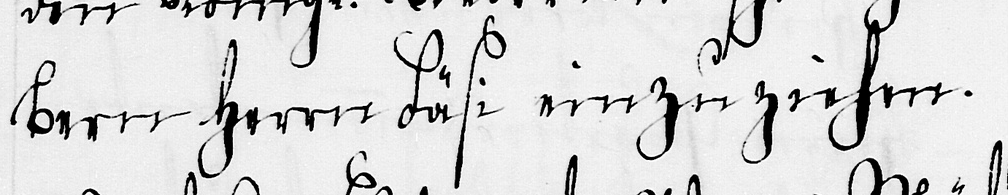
Bern Herrn Fäsi einzuziehen.
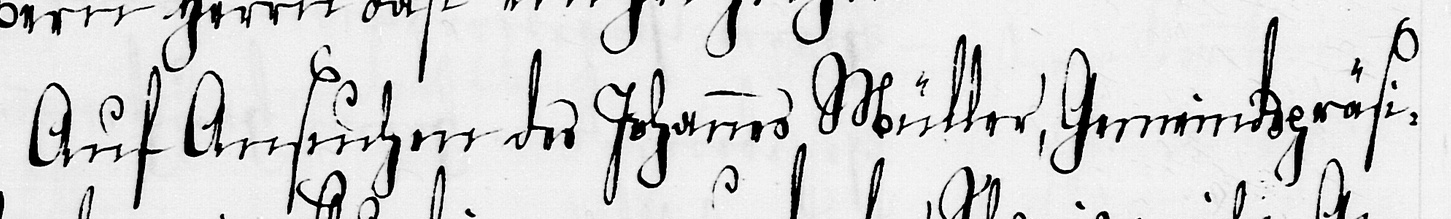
Auf Ansuchen des Johannes Müller, Gemeindspräsi¬
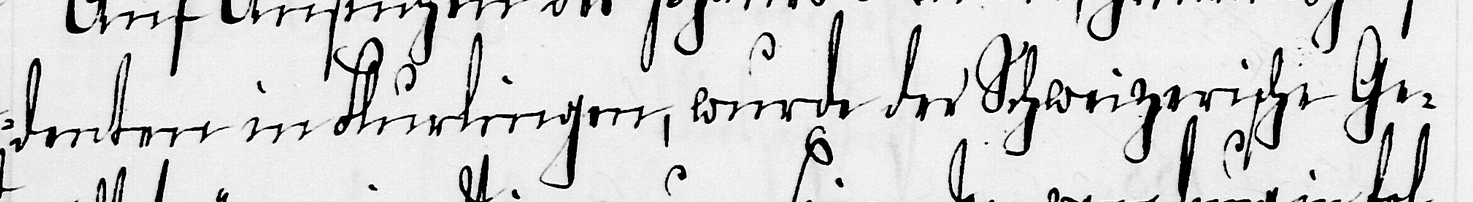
denten in Flurlingen, wurde der Schweizerische Ges¬
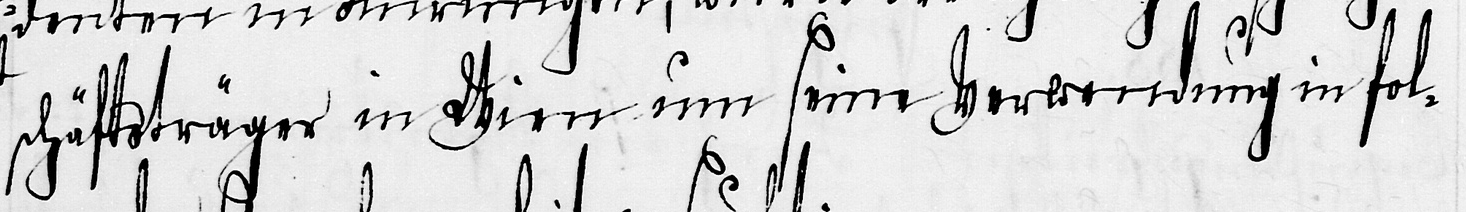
chäftsträger in Wien um seine Verwendung in fol¬
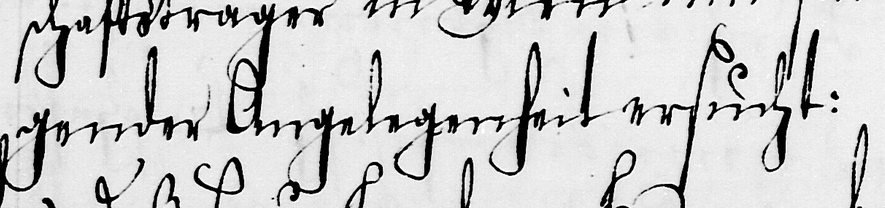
gender Angelegenheit ersucht:
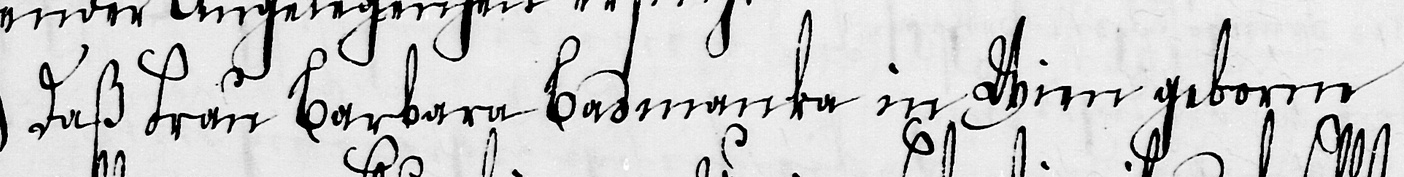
Daß Frau Barbara Basmanka in Wien geborne
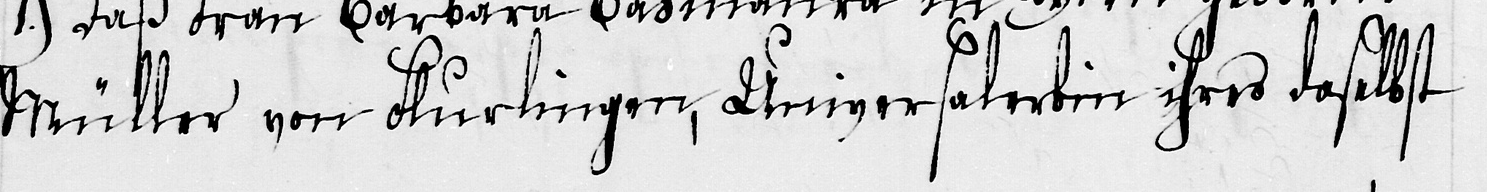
Müller von Flurlingen, Universalerbin ihres daselbst
